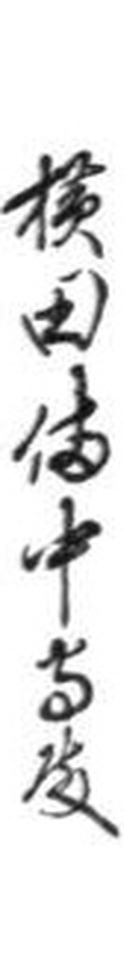横田備中守殿
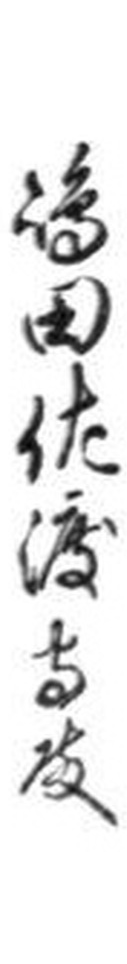嶋田佐渡守殿
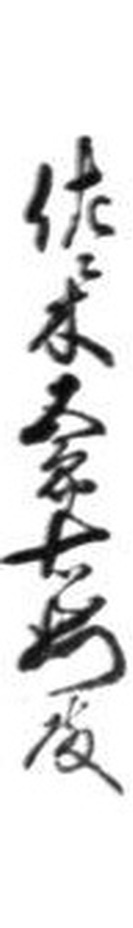佐々木五郎右衛門殿
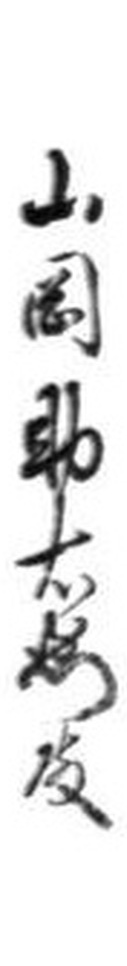山岡助右衛門殿
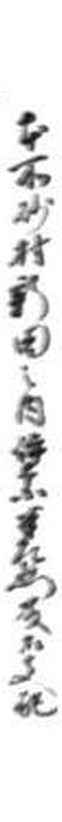本所砂村新田之内伊奈半左衛門殿御支配
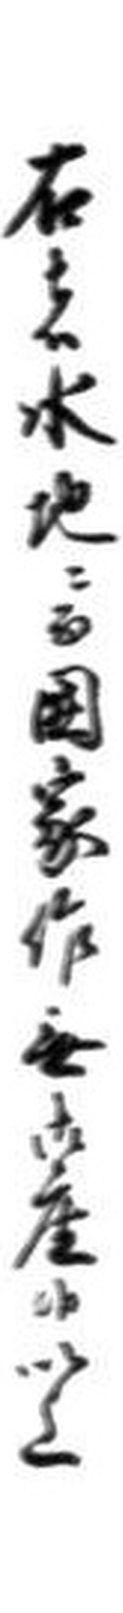右者水地ニ而囲家作無御座候以上
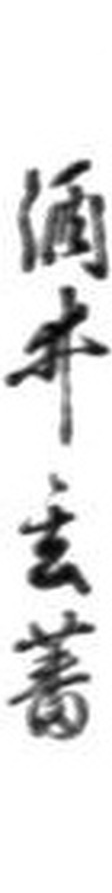酒井玄蕃
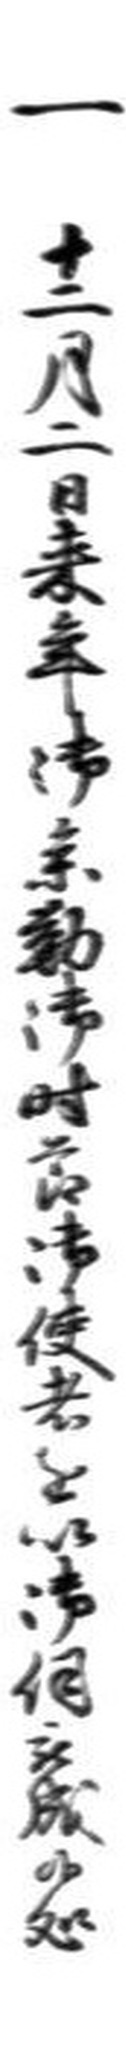一十二月二日来年御参勤御時節御使者を以御伺被成候処
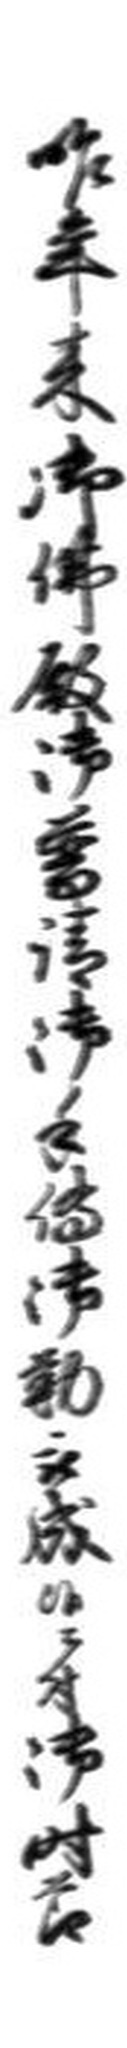昨年来御仏殿御普請御手伝御勤被成候ニ付御時節
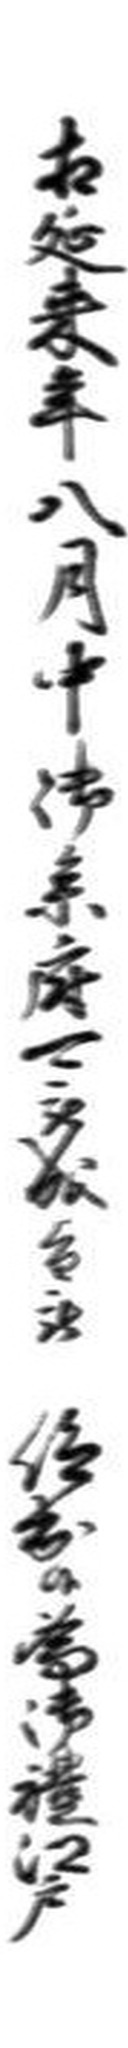相延来年八月中御参府可被成旨被仰出候為御礼江戸

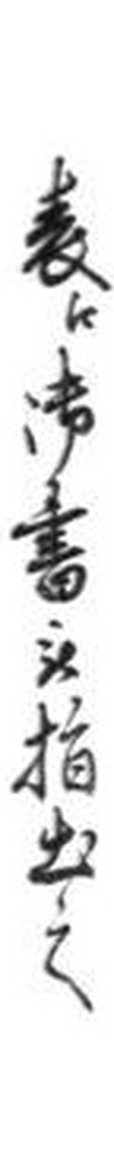表江御書被指出之
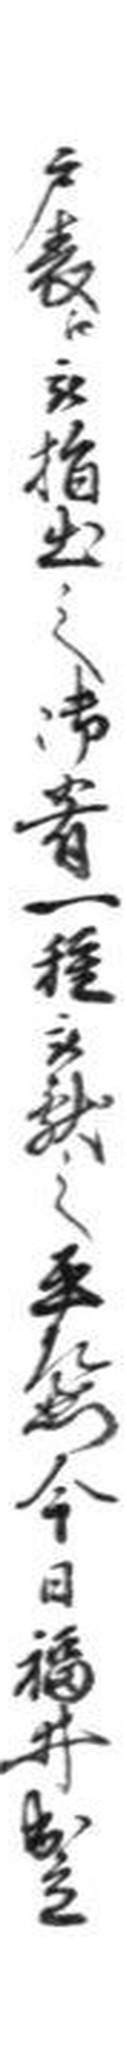戸表江被指出之御肴一種被献之平左衛門今日福井出立
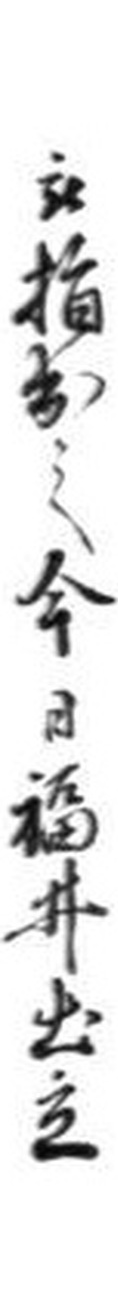被指出之今日福井出立
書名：家譜 三十二 吉邦公 従享保二年到享保三年
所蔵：福井県文書館 Fukui Prefectural Archives
